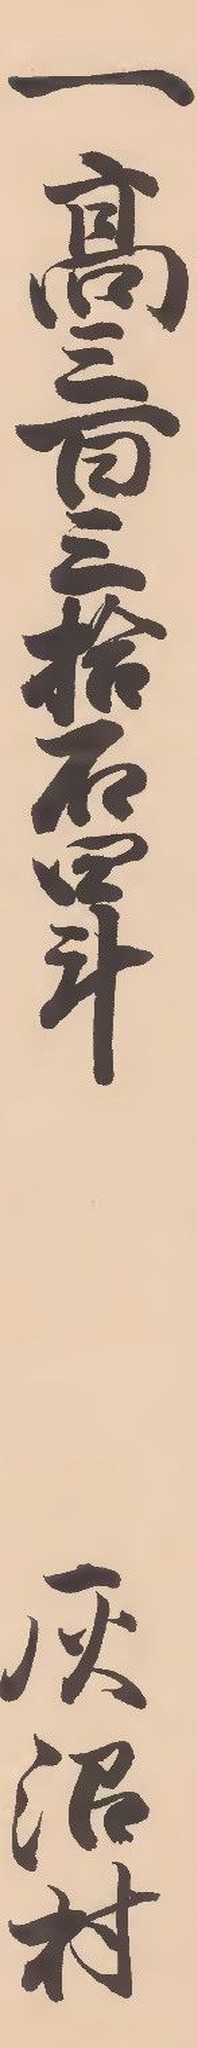一高三百三拾石四斗灰沼村
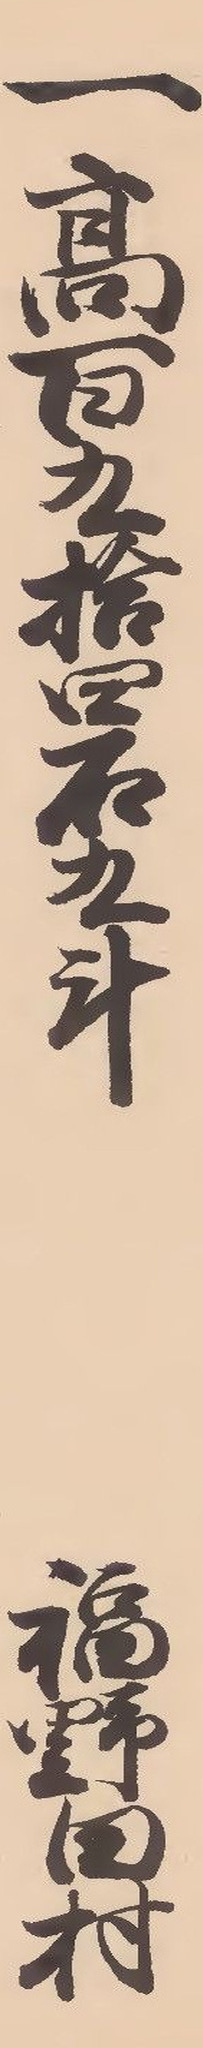一高百九拾四石九斗福野田村
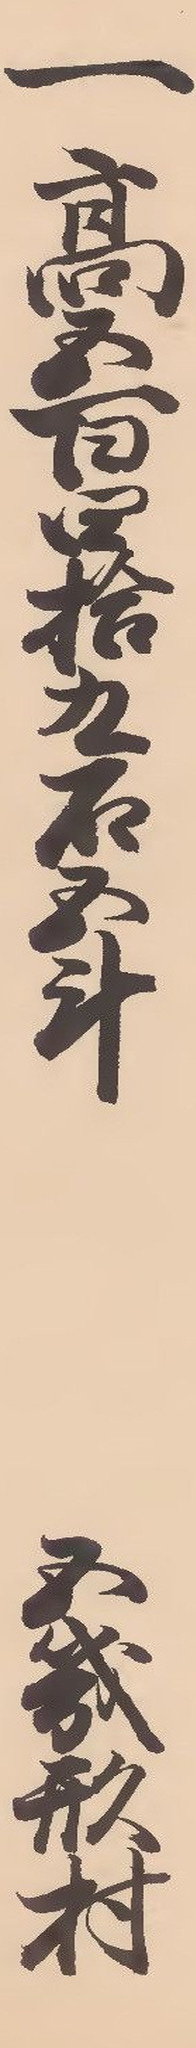一高五百四拾九石五斗五幾形村
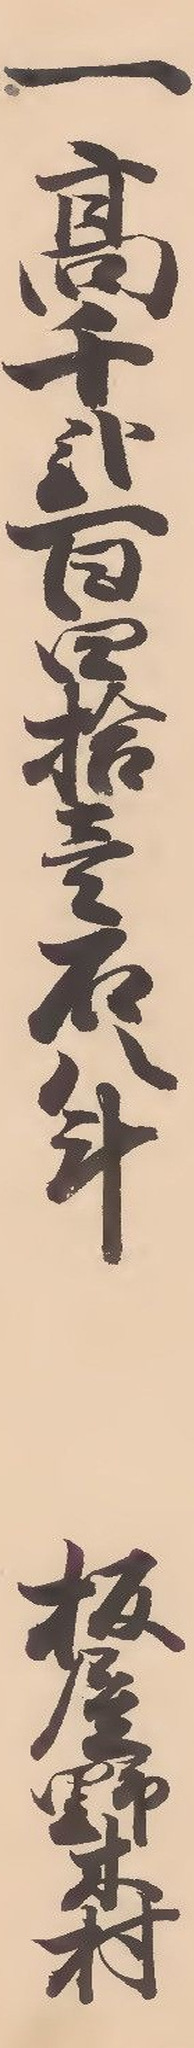一高千弐百四拾壱石八斗板屋野木村

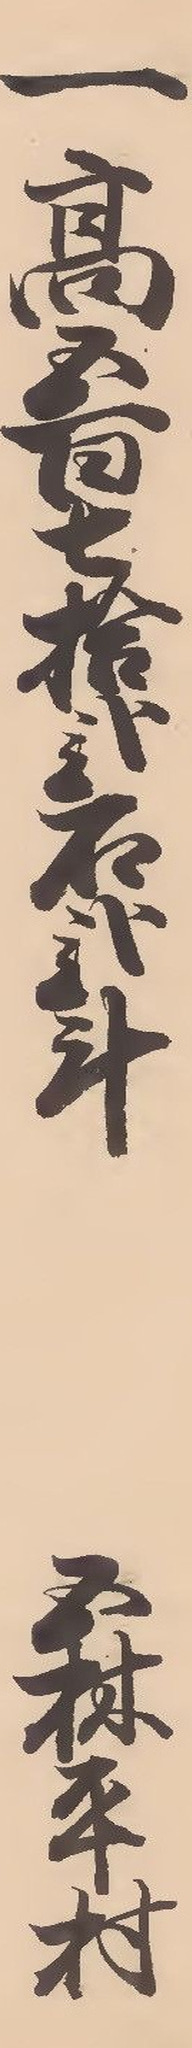一高五百七拾弐石弐斗五林平村
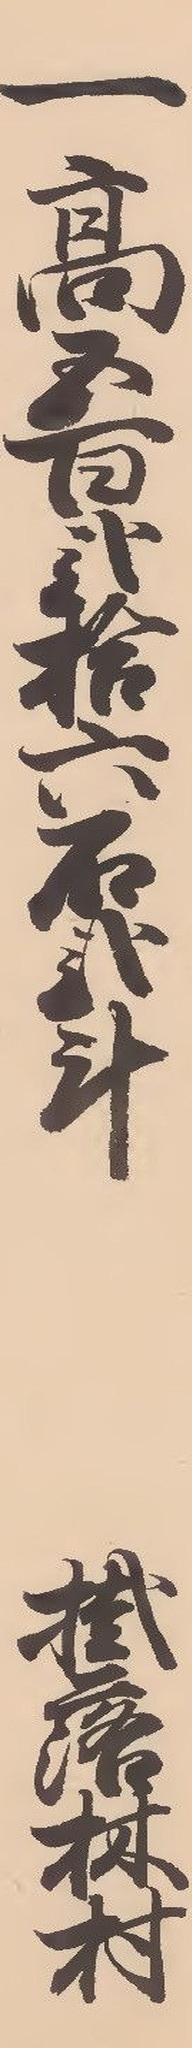一高五百弐拾六石弐斗掛落林村
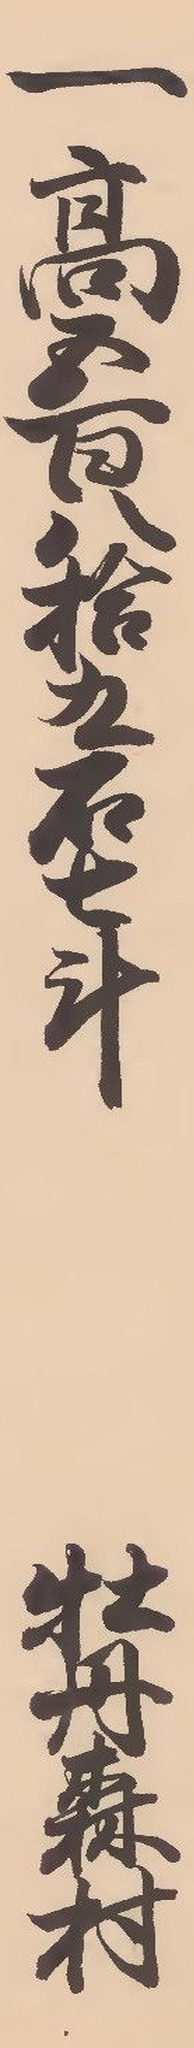一高五百八拾九石七斗牡丹森村
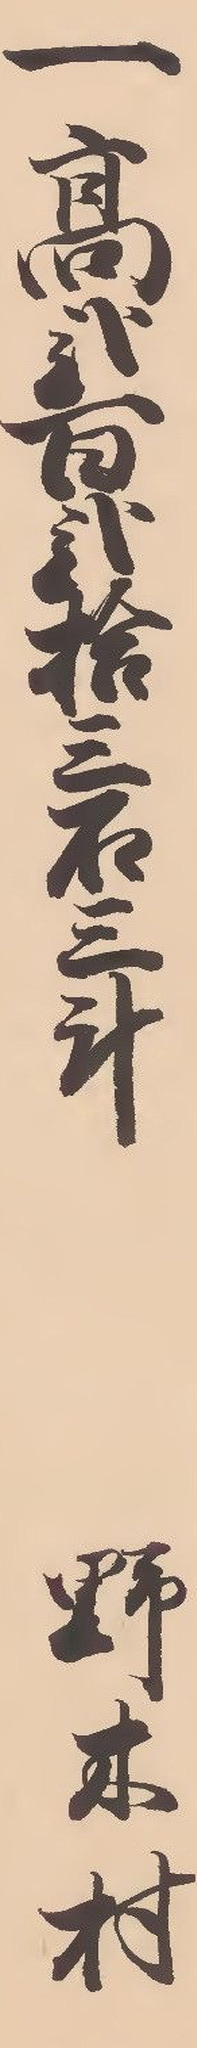一高弐百弐拾三石三斗野木村

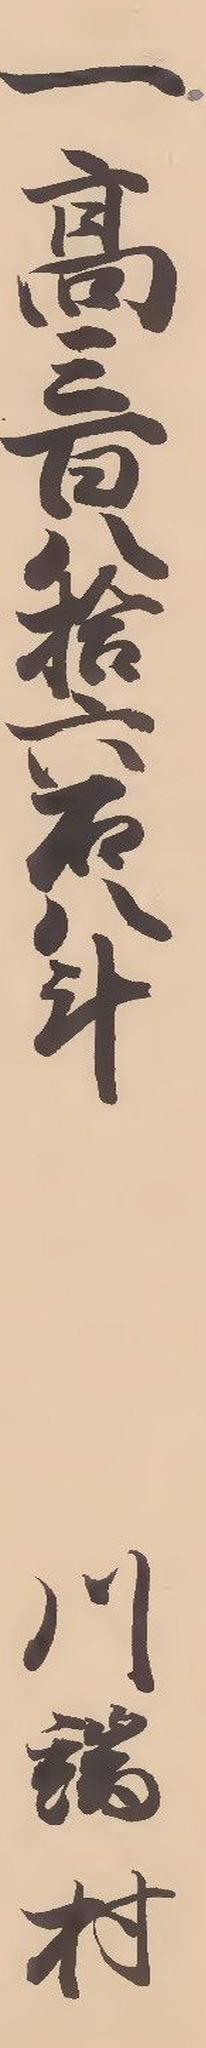一高三百八拾六石八斗川端村
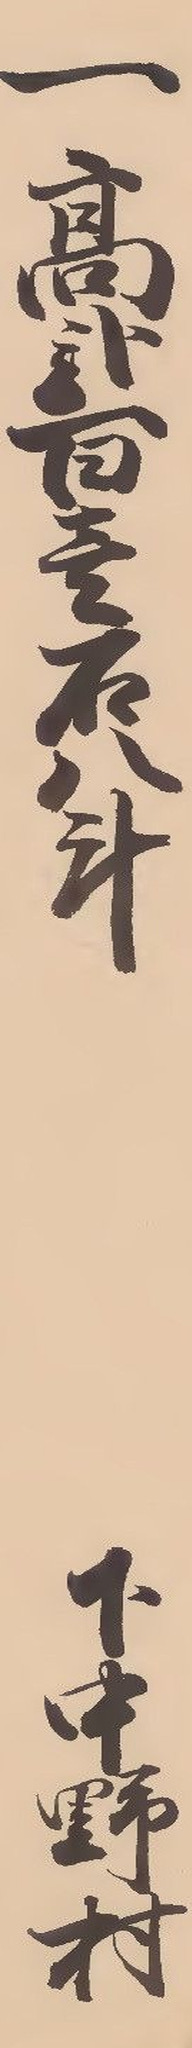一高弐百壱石八斗下中野村
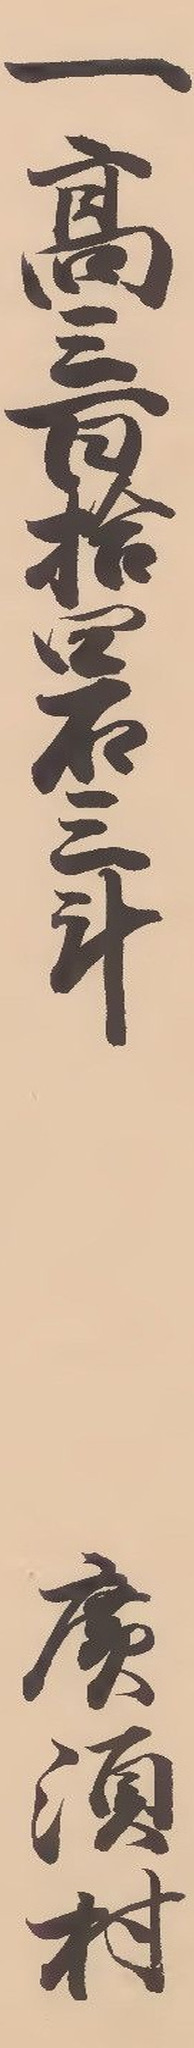一高三百拾四石三斗広須村
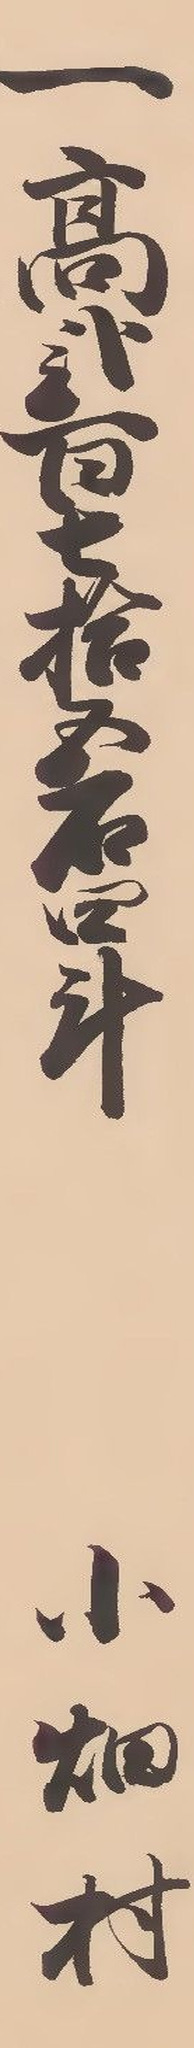一高弐百七拾五石四斗小畑村
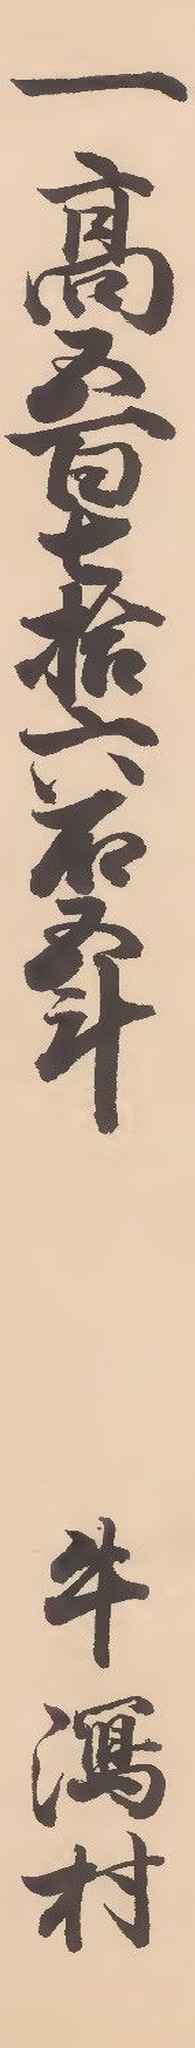一高五百七拾六石五斗牛潟村

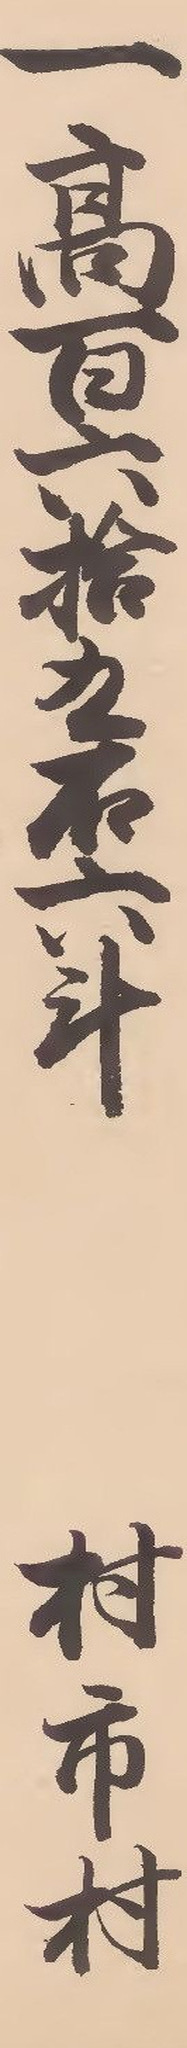一高百六拾九石六斗村市村
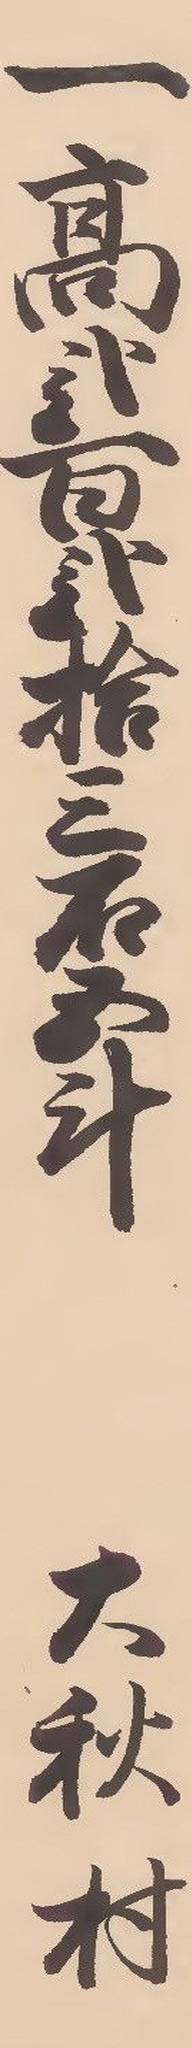一高弐百弐拾三石五斗大秋村
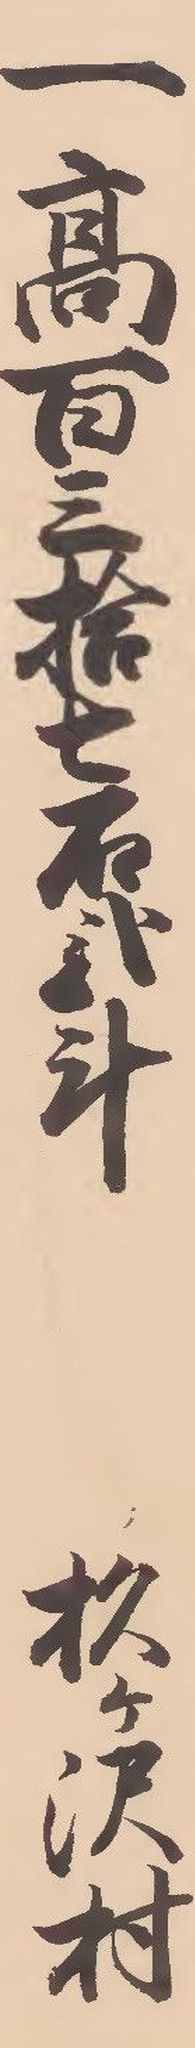一高百三拾七石弐斗杉ヶ沢村
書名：陸奥国郷帳　７
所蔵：国立公文書館 National Archives of Japan
